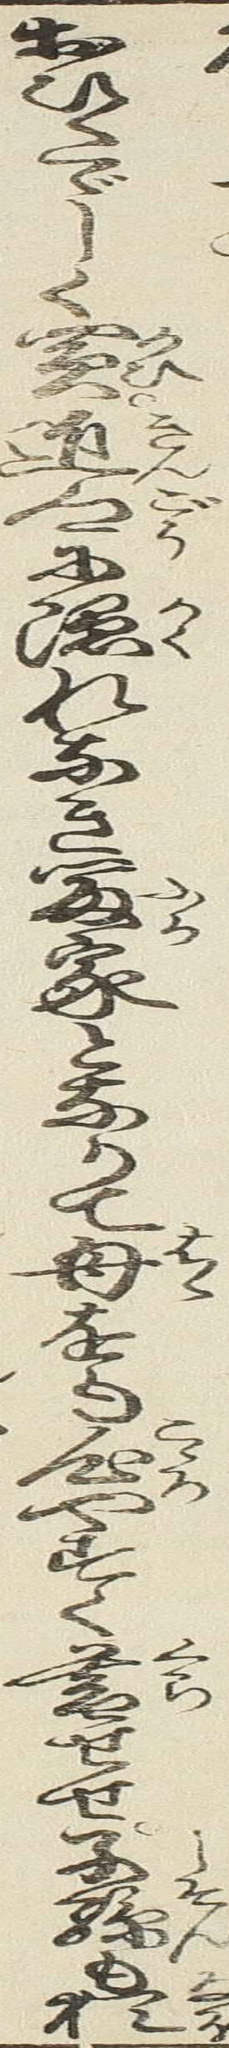おひたゞしく買。近郷に隠れなき富家となりて母をも心やすく暮せせ。子孫も猶
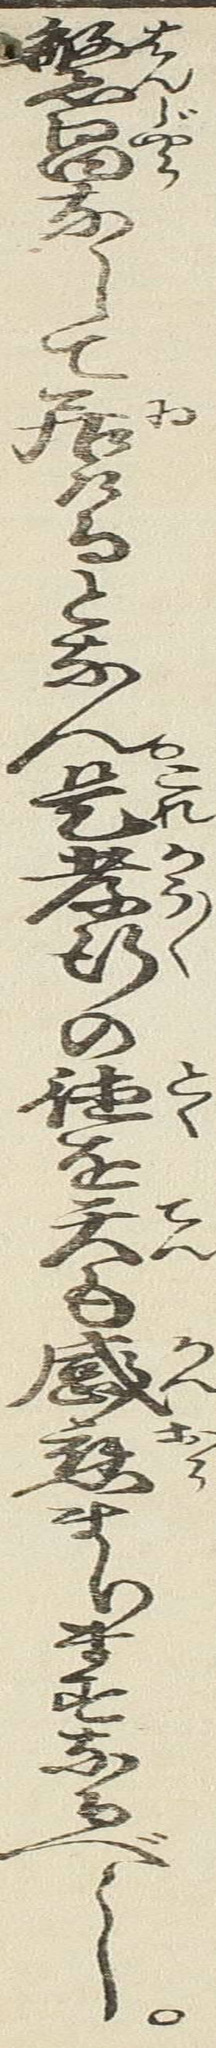繁昌なして居けるとなん。是孝行の徳を天も感応ましりますなるべし。
